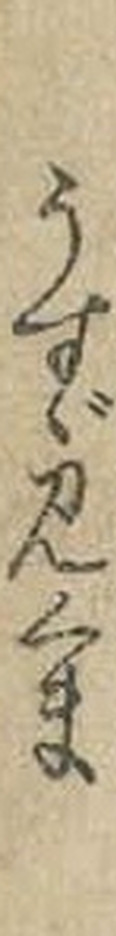うすゞみくま

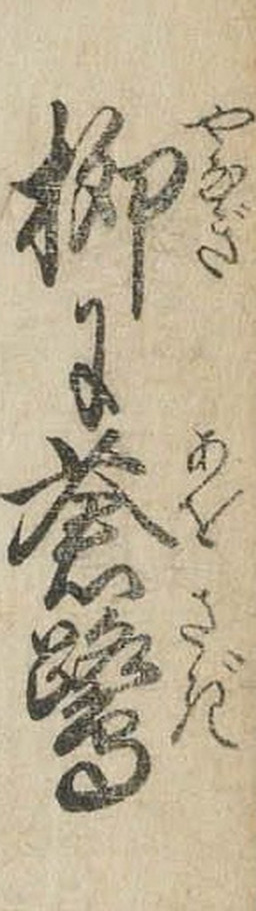柳に蒼鷺
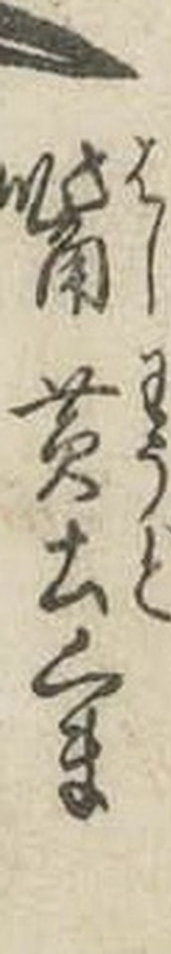嘴黄土くま
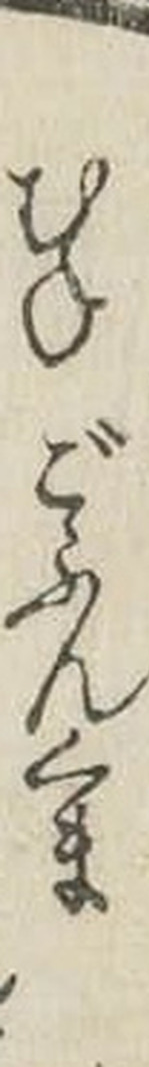むねごふんくま
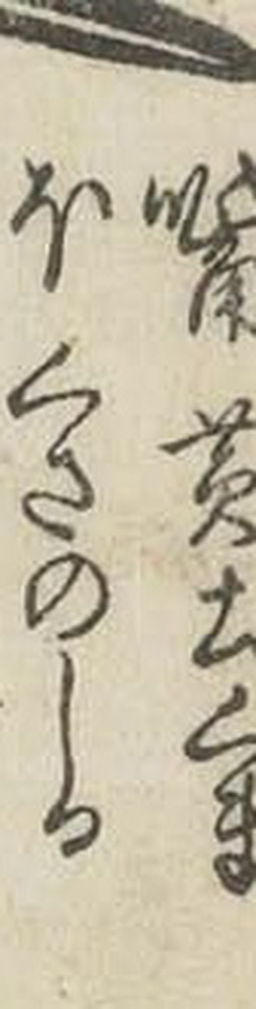ほくさのしる
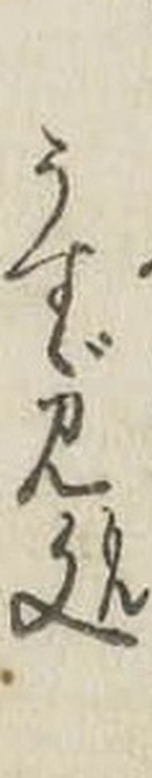うすゞみ文
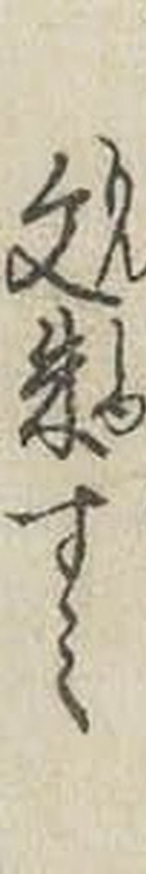文朱すみ

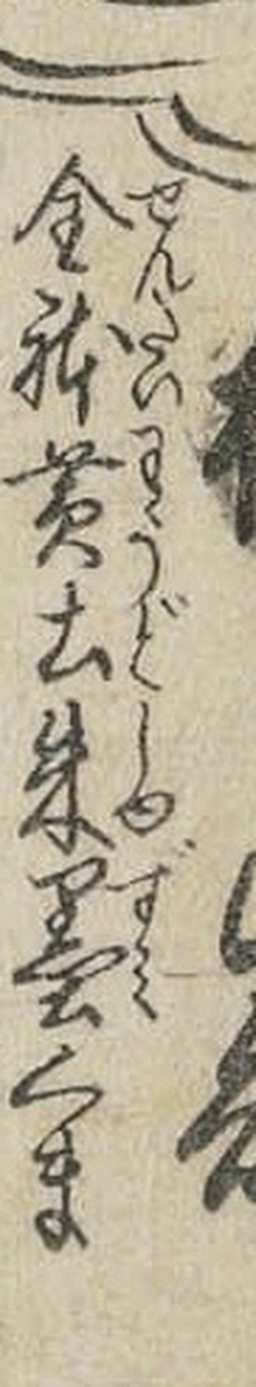全体黄土朱墨くま
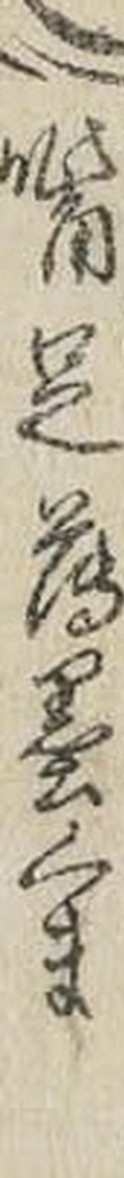嘴足薄墨くま
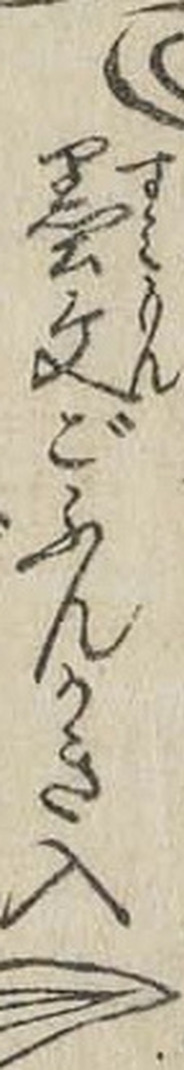墨文ごふんかき入
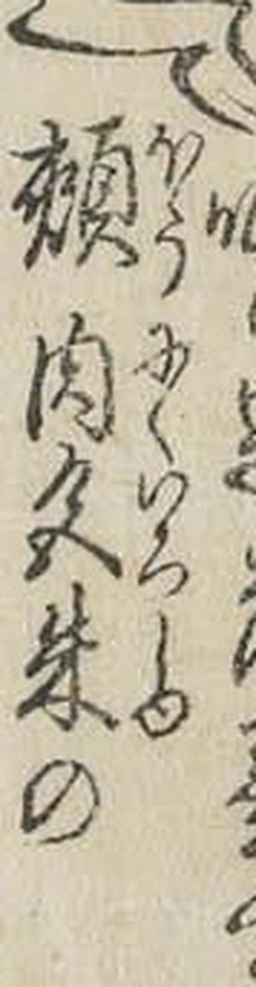頬肉色朱の
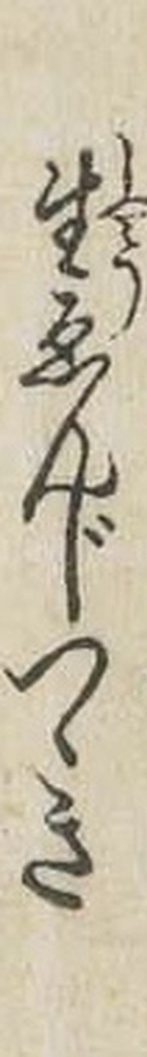生ゑんじつゝき
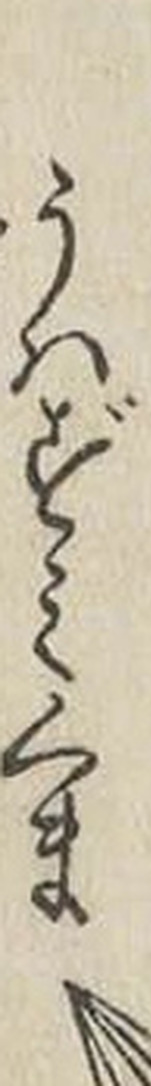うはずみくま
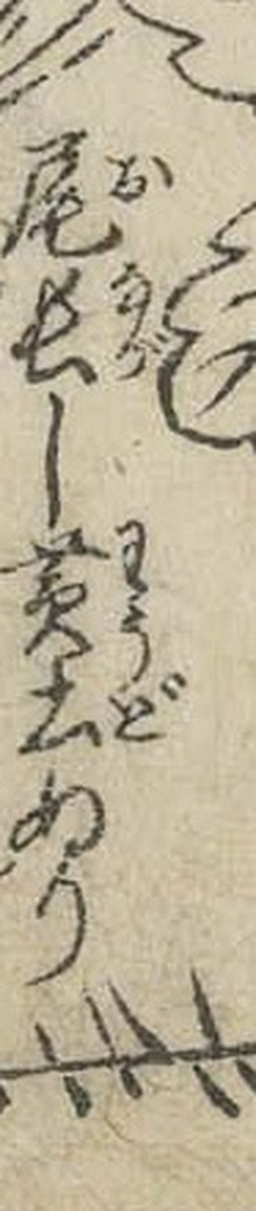尾長し黄土ぬり
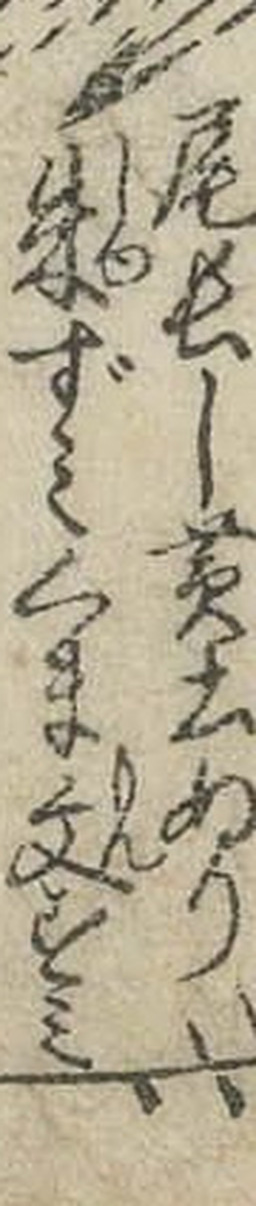朱ずみくま文すみ
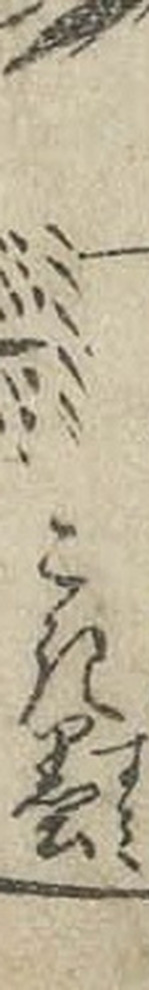こき墨
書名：絵本写宝袋 9巻 8之巻
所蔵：東京学芸大学教育コンテンツアーカイブ
